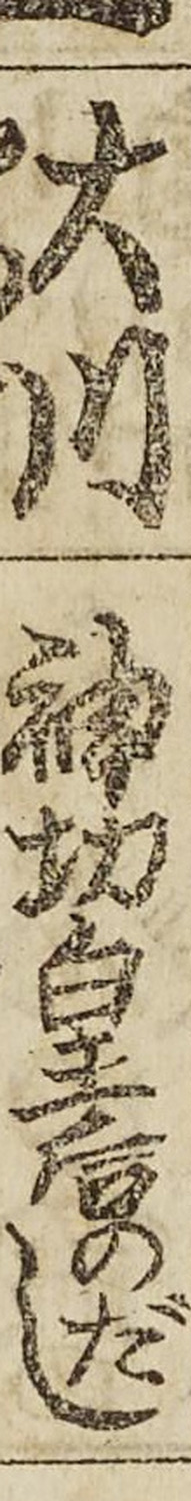二大川神功皇后のだし
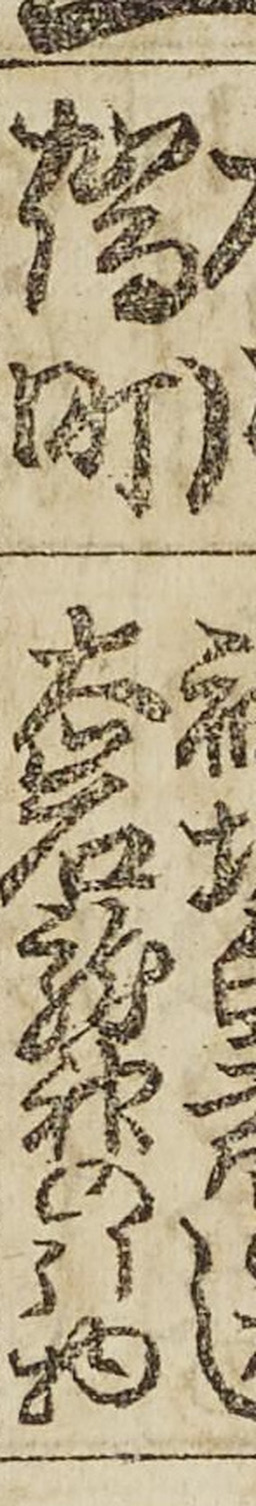端町大岩龍神の引物
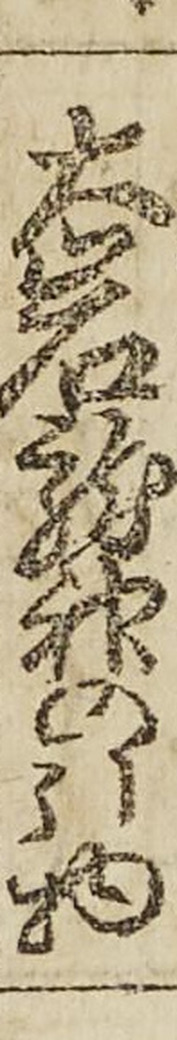端町大岩龍神の引物
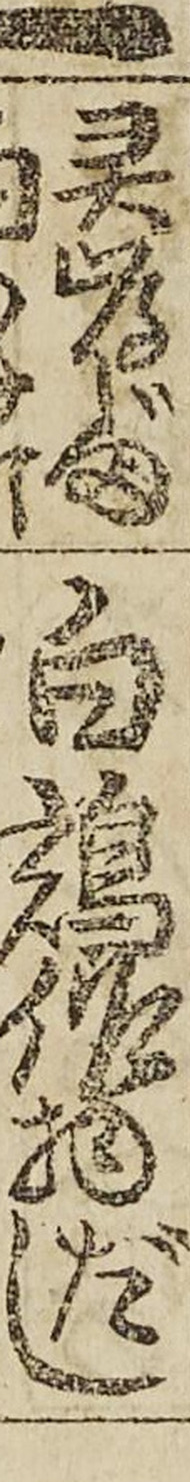三霊岸じま白鶴作物だし
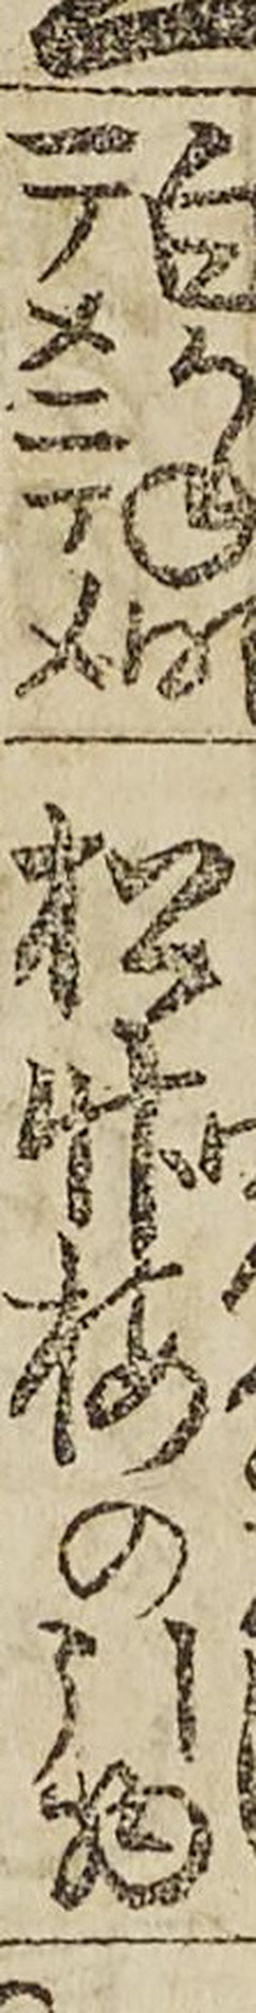一丁メ二丁メ
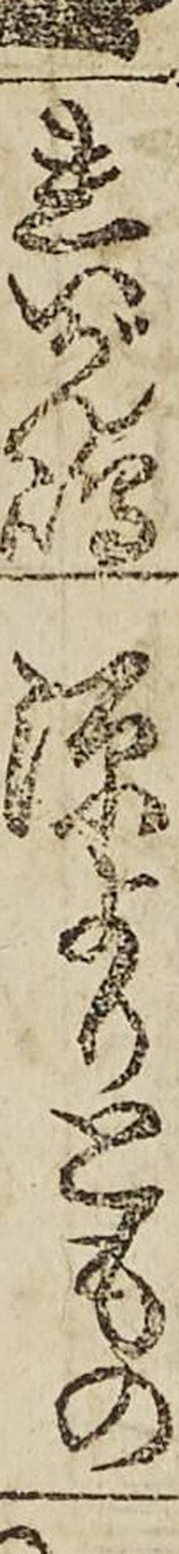四れいがん嶋源よりともの
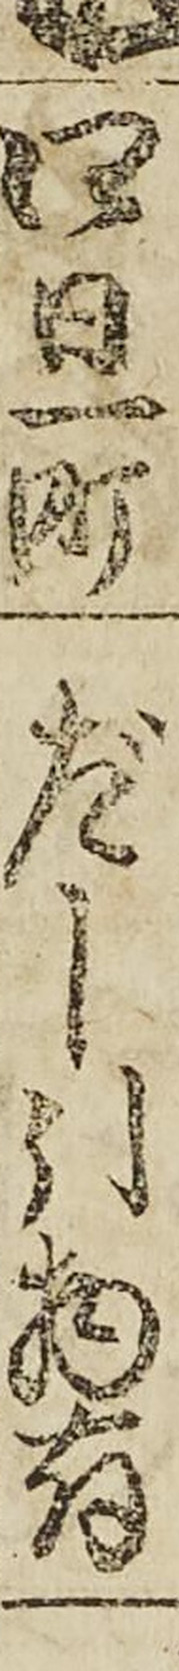四日一町だし引物有
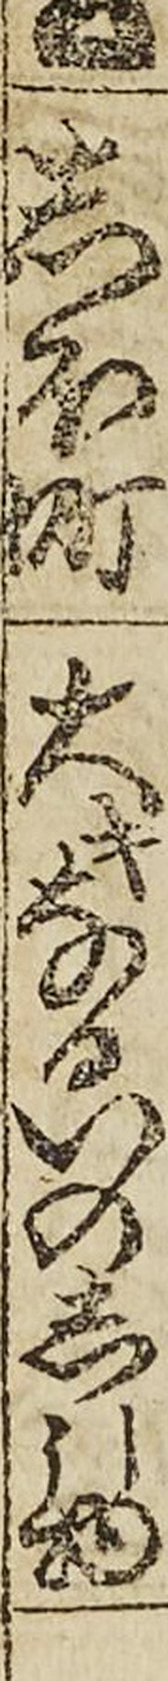しほ町大キなるいのし引物
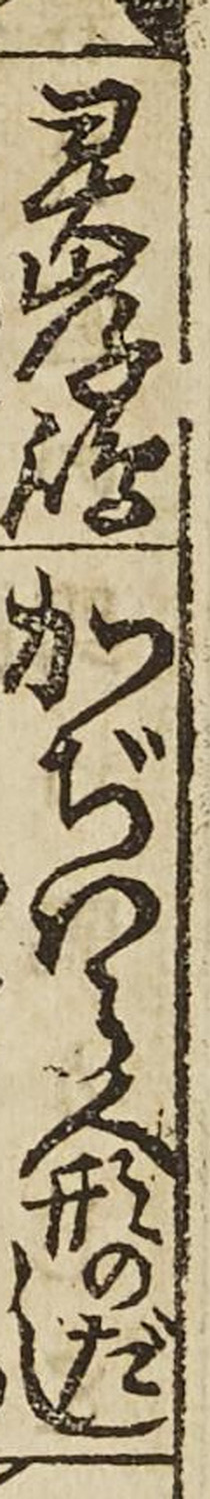六霊岸嶋かぢはら人形のだし
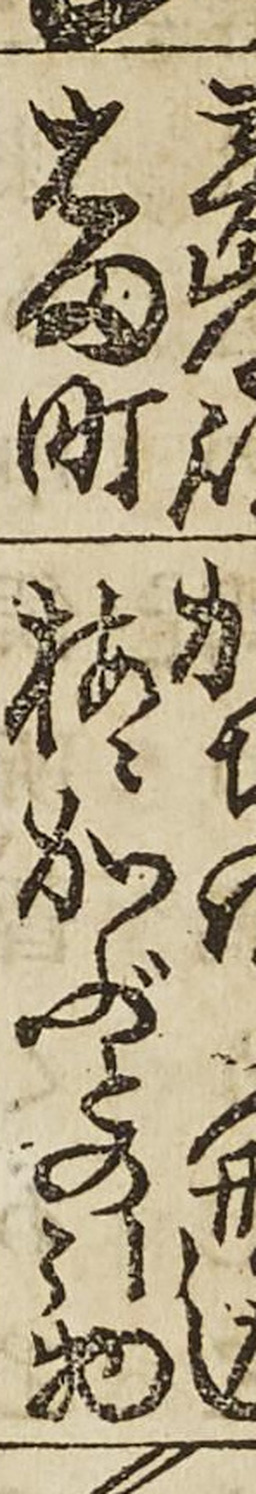はま町桜にかぶとの引物
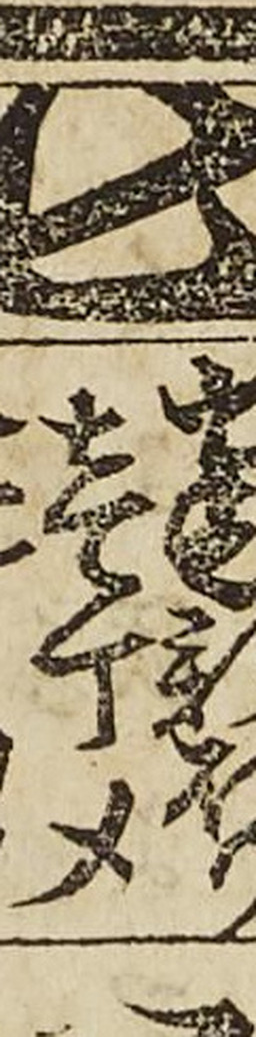二丁メ
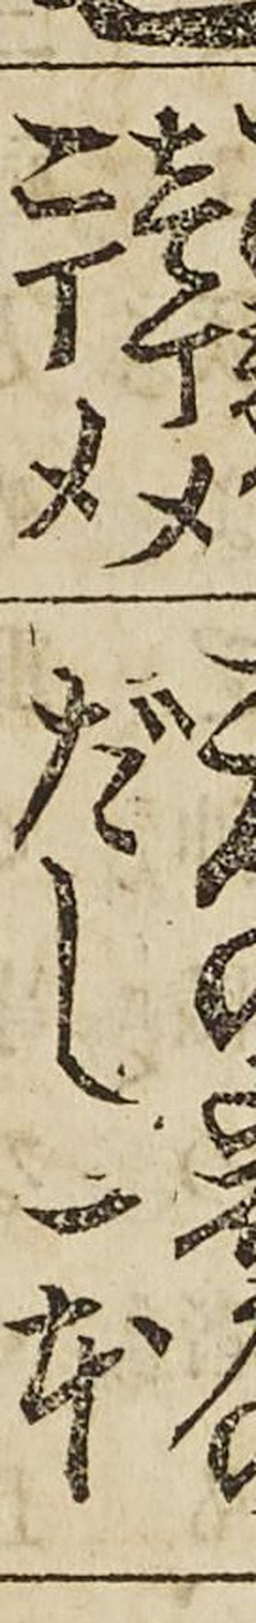壱丁メだし一本
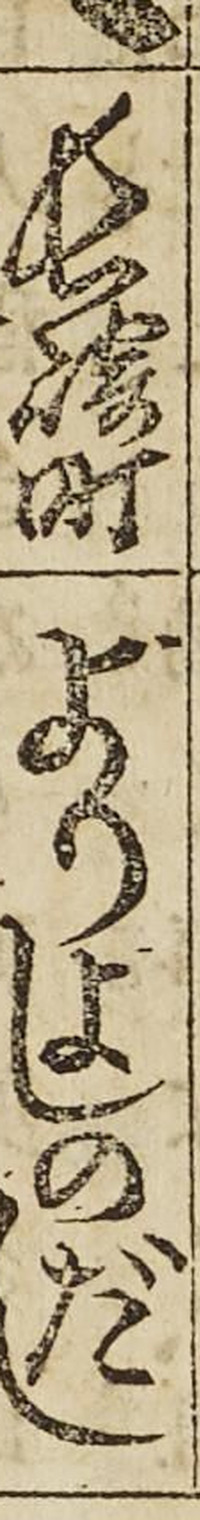八長崎町よりよしのだし
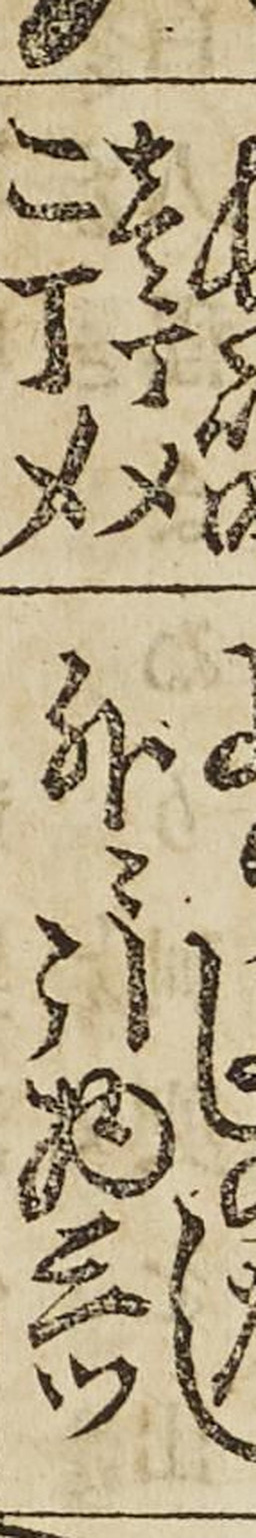壱丁メ外に引物三ツ
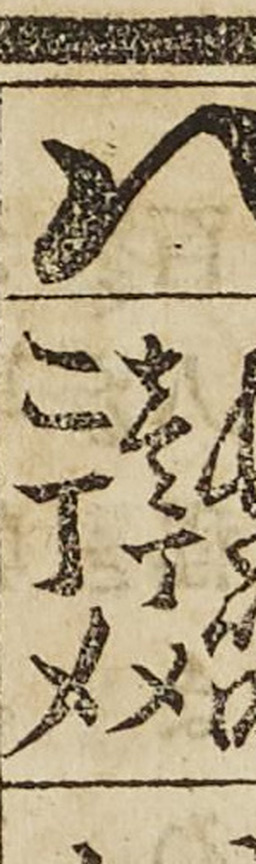二丁メ
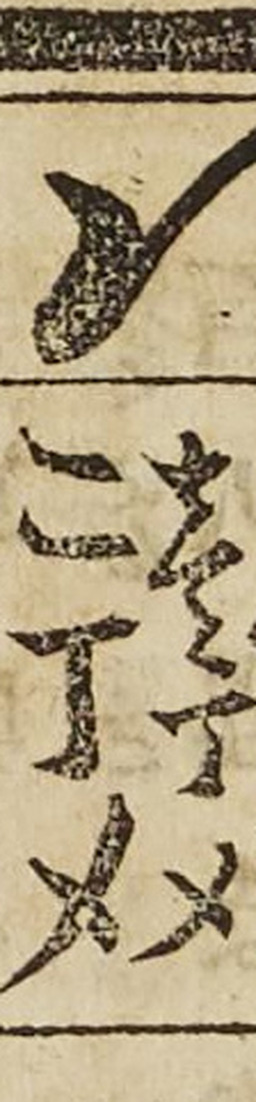二丁メ
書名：永代惨話　文化の夢　全
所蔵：東京大学地震研究所図書室 Earthquake Research Institute Library, The University of Tokyo, JAPAN
